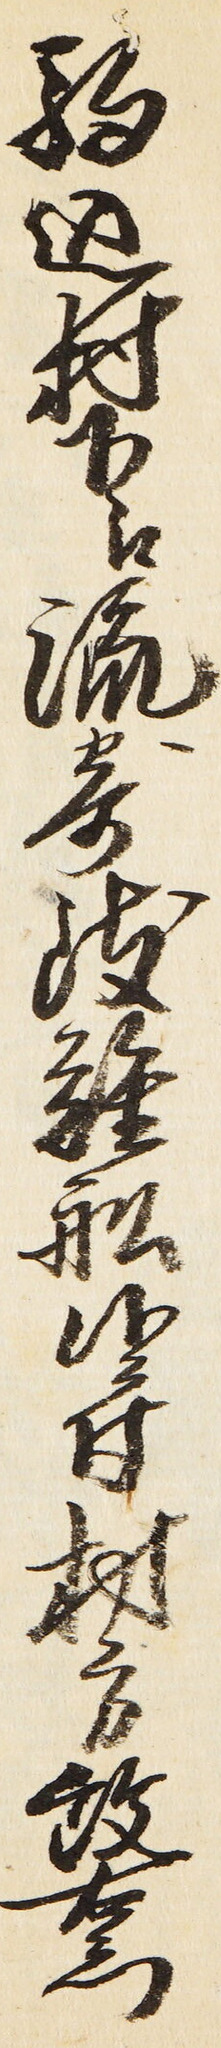駒込村下江流寄致難船候ニ付村方政右衛門
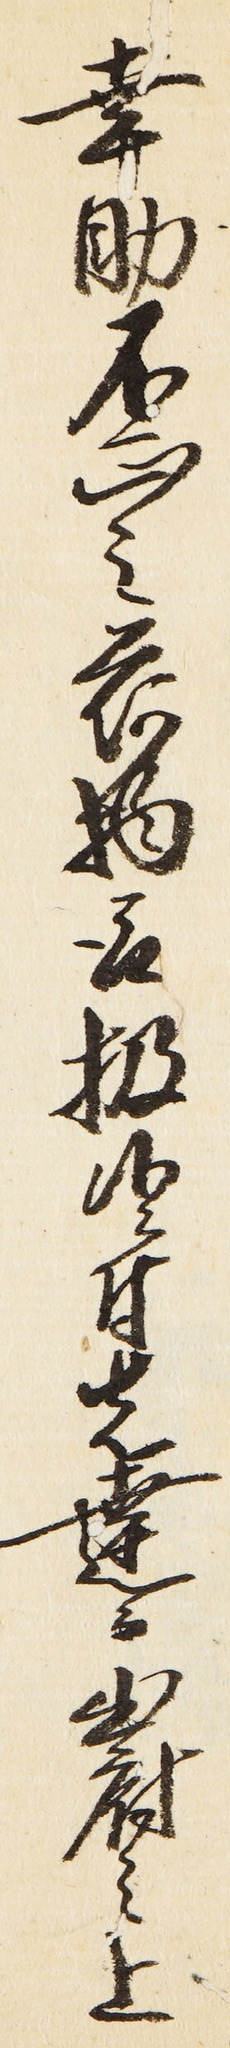幸助不正之荷物取扱候ニ付先達而出府之上
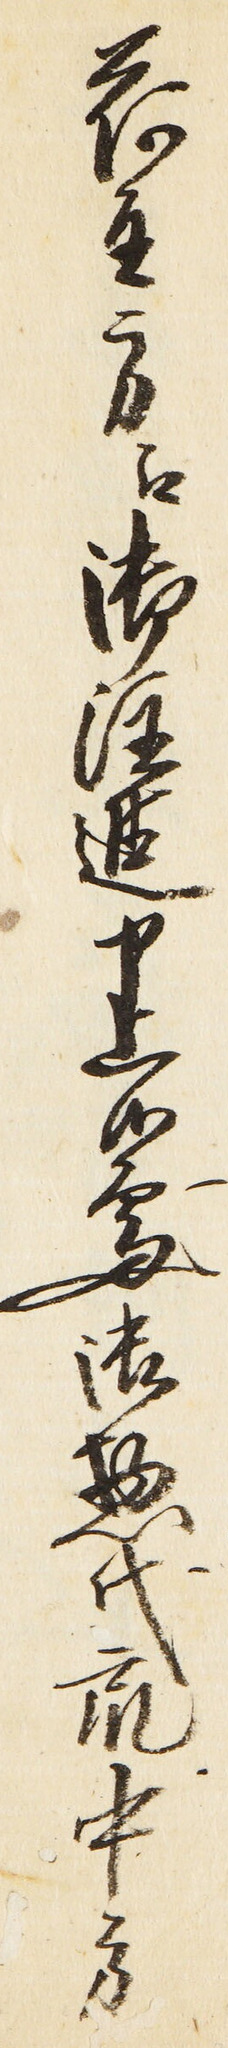荷主方江御注進申上候処御惣代衆方
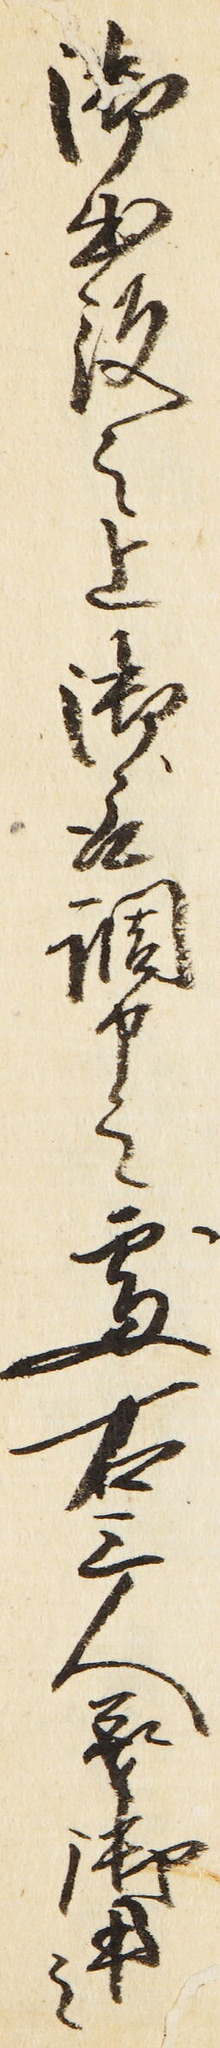御出役之上御取調中之処右三人御用之

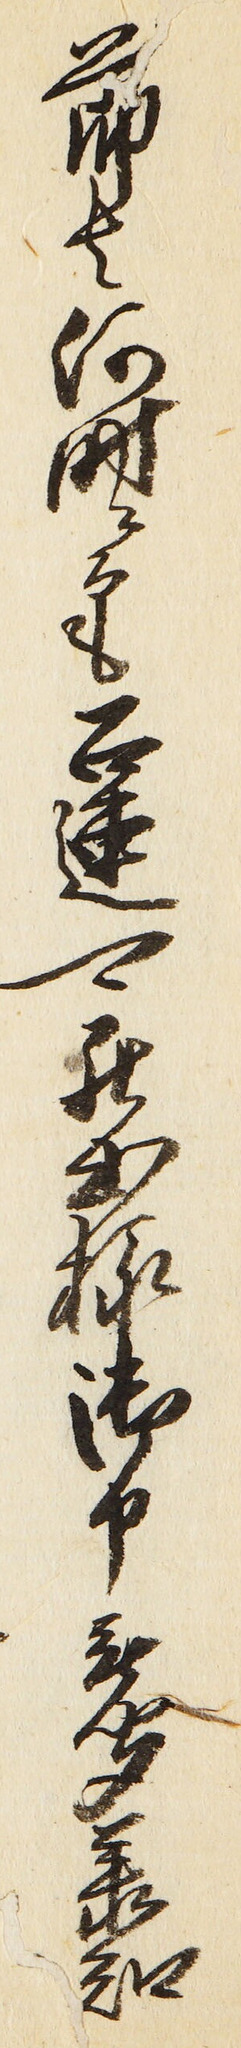筋者何時ニ而も召連可罷出様御申被聞承知
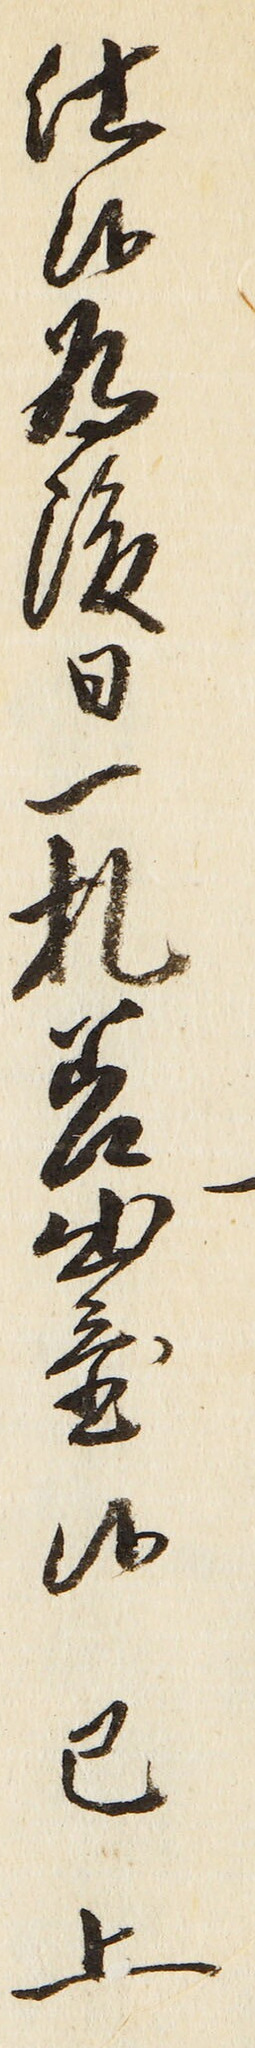仕候為後日一札差出置候已上
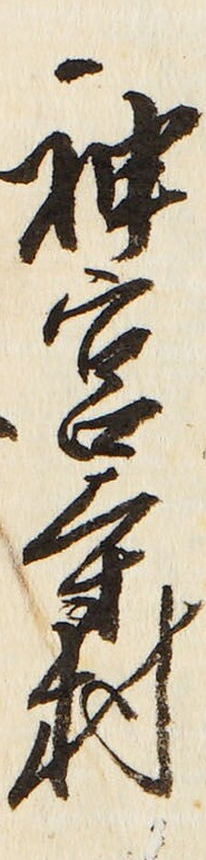神宮寺村
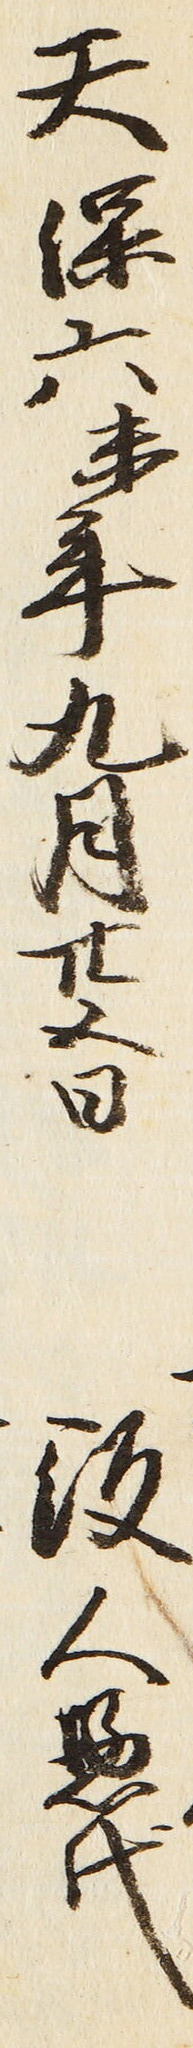天保六未年九月廿五日役人惣代
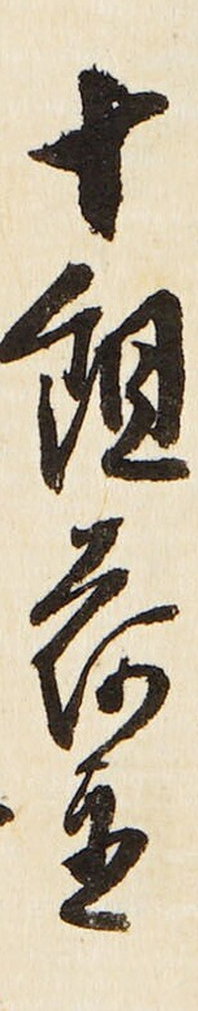十組荷主
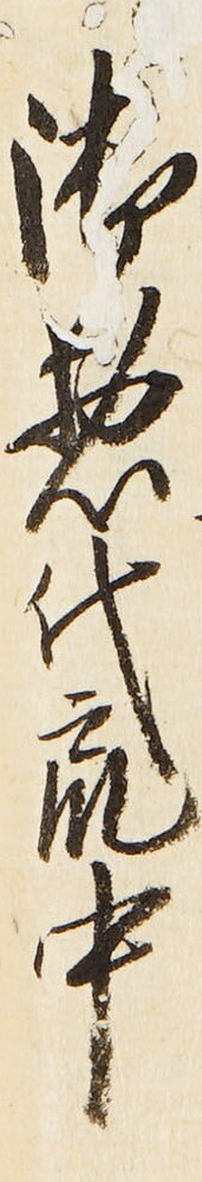御惣代衆中
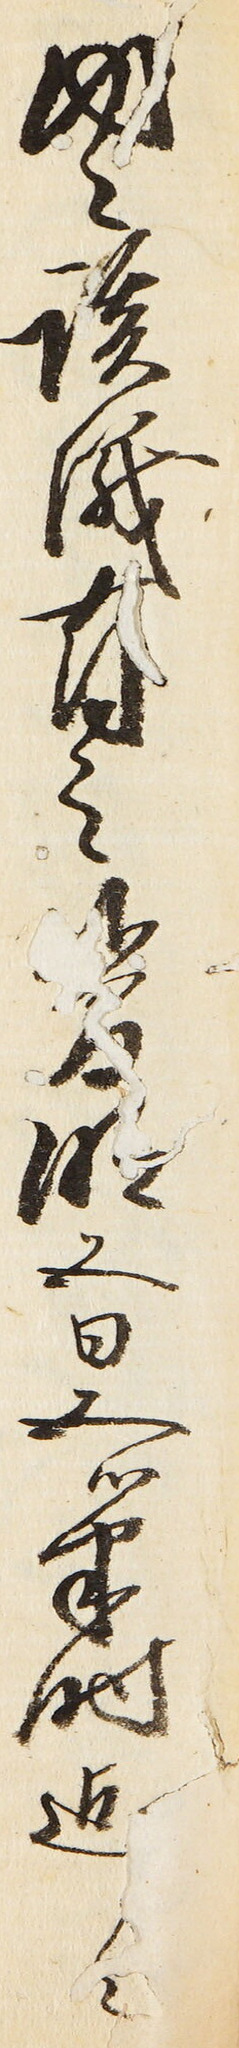内々談儀有之候間明五日五ツ半時迄
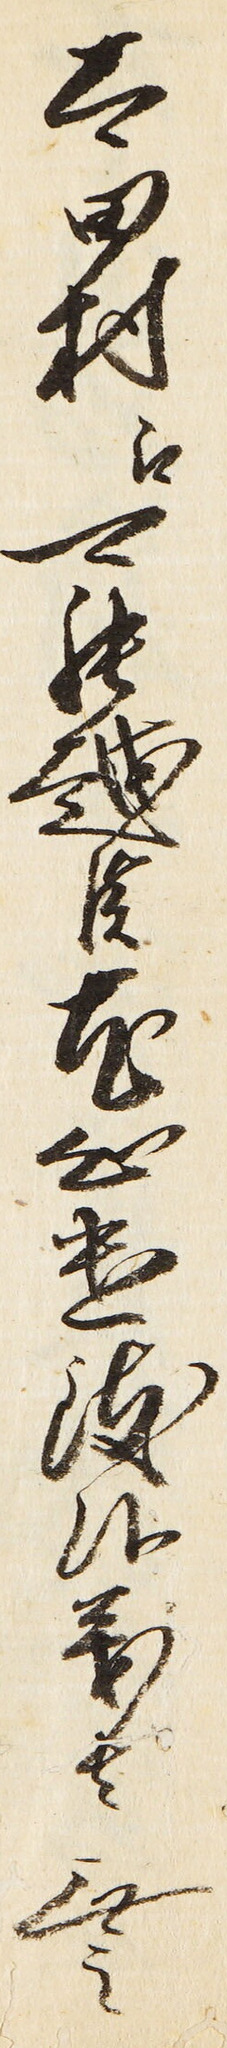太田村江可罷越候尤心遣致候義者無之
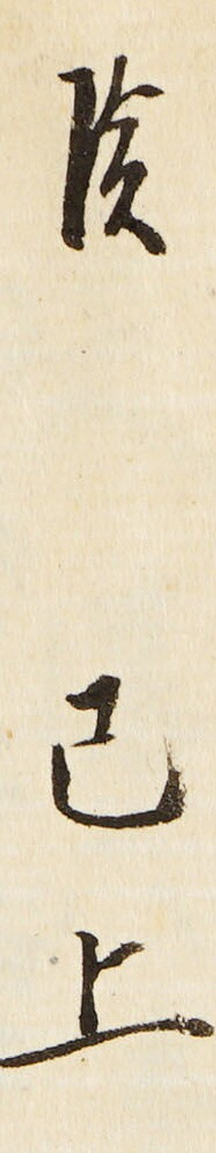候已上
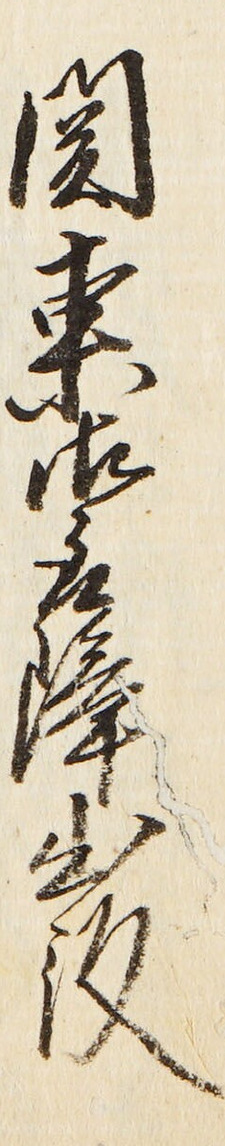関東御取障出役

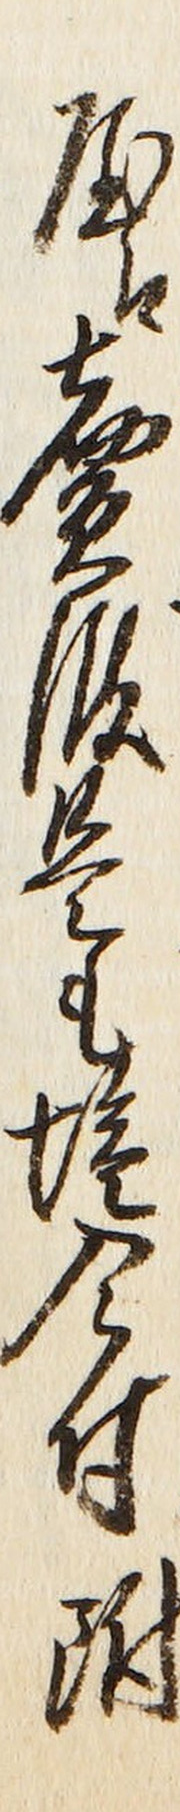屋江売渡是も塩入ニ付付
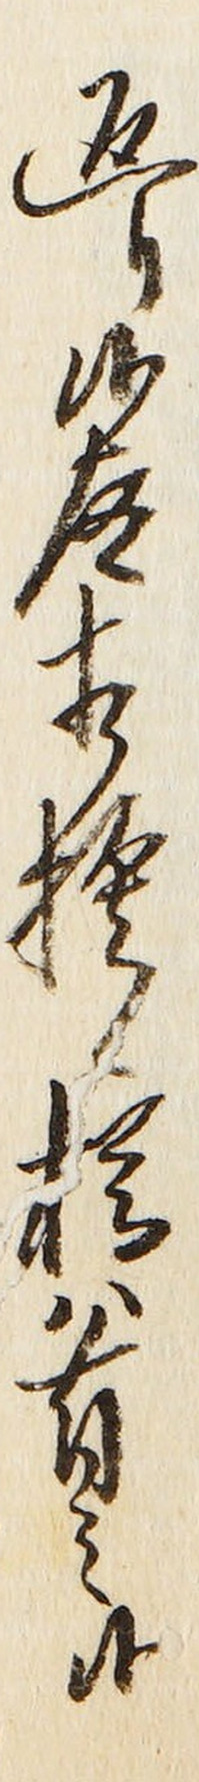返り候故相捨候樽ハ有之候
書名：難船一件記録
